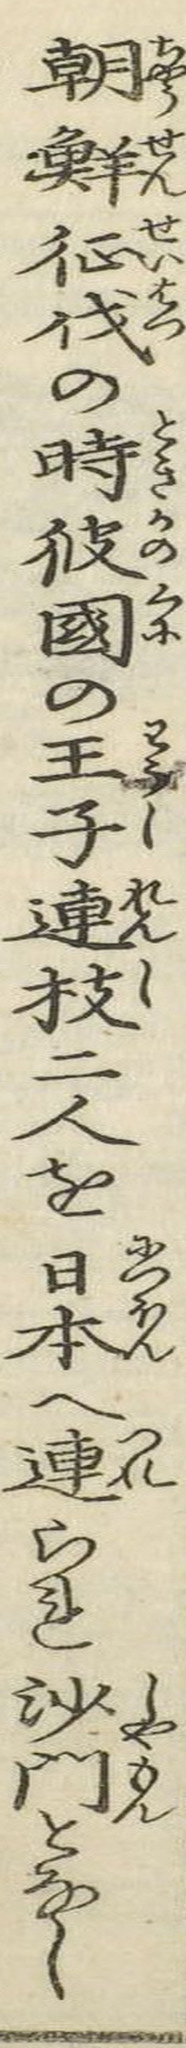朝鮮征伐の時彼國の王子連枝二人を日本へ連られ沙門となし
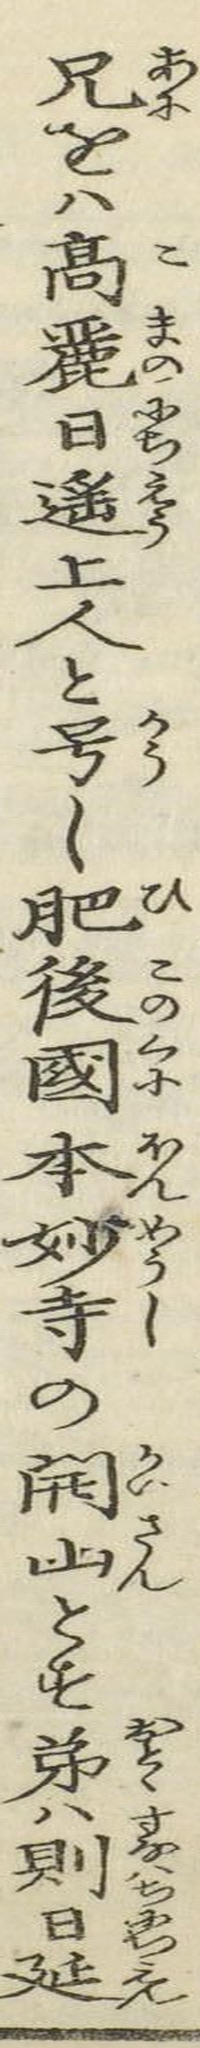兄をは髙麗日遥上人と号し肥後國本妙寺の開山とす弟は則日延
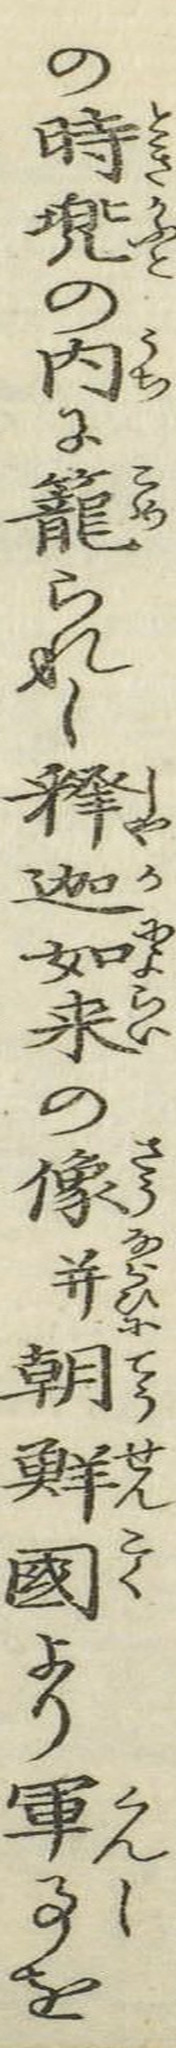の時兠の内に籠られし釋迦如来の像并朝鮮國より軍事を
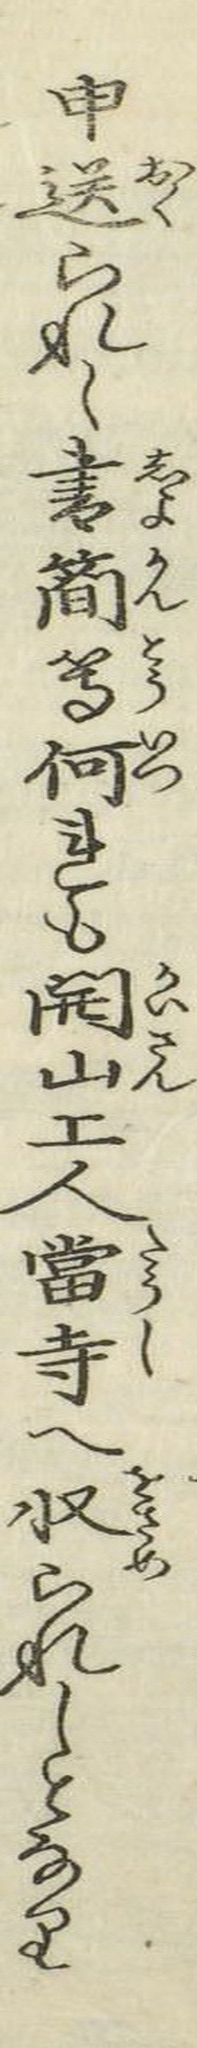申送られし書簡等何れも開山上人當寺へ収られしとなり
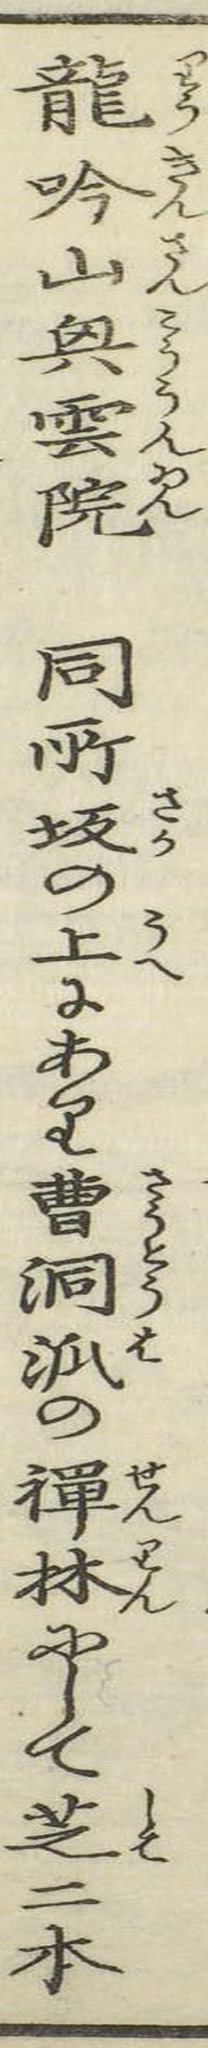龍吟山興雲院同所坂の上にあり曹洞派の禪林にして芝二本
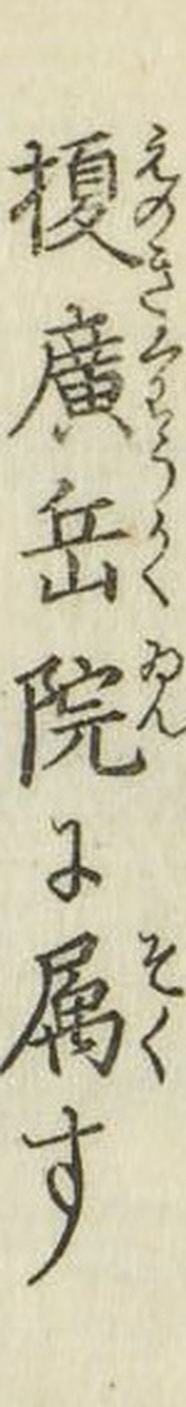榎廣岳院に属す
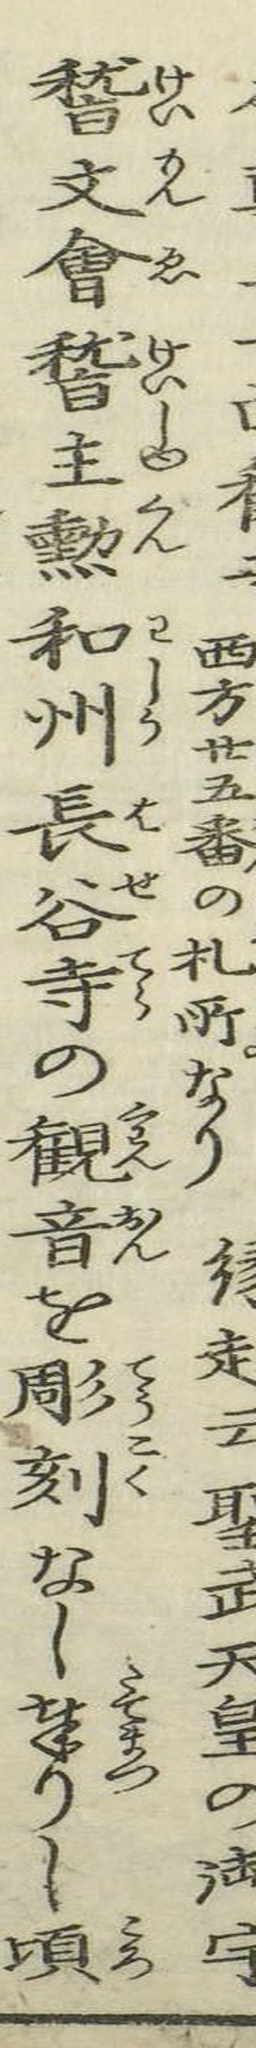稽文會稽主勳和州長谷寺の観音を彫刻なし奉りし頃
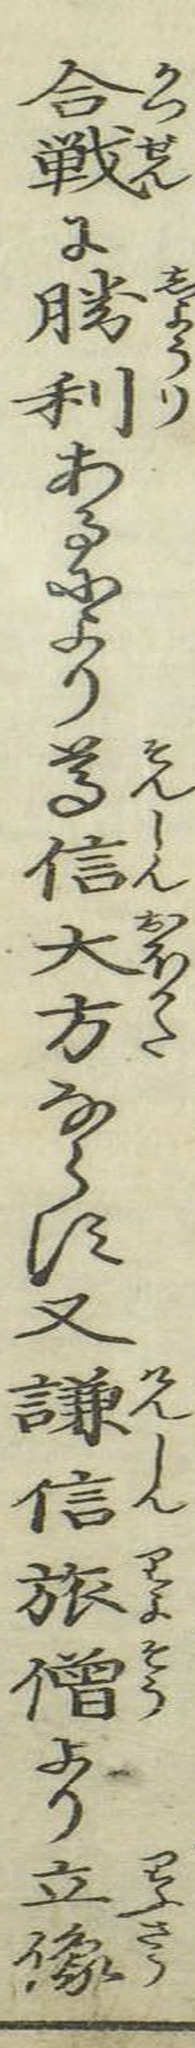合戦に勝利あるにより尊信大方ならす又謙信旅僧より立像

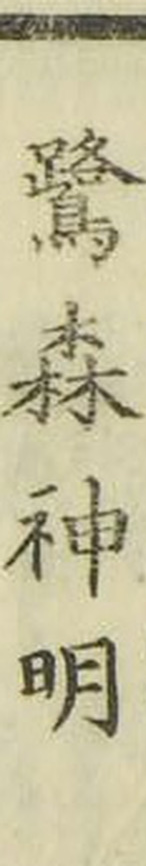鷺森神明
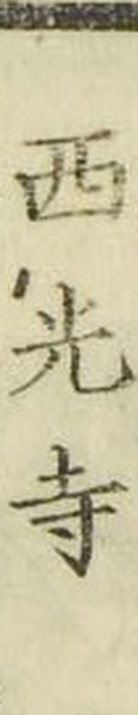西光寺
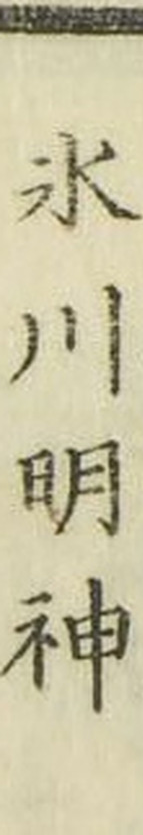氷川明神

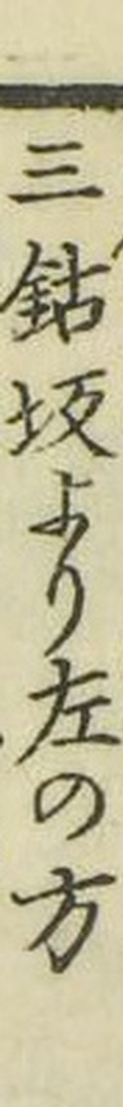三鈷坂より左の方
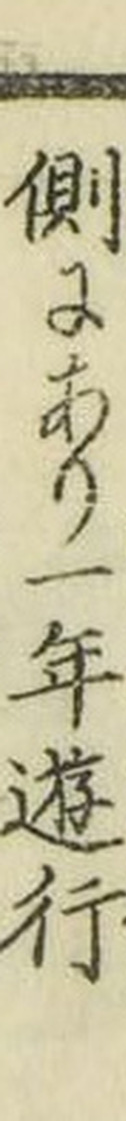側にあり一年遊行
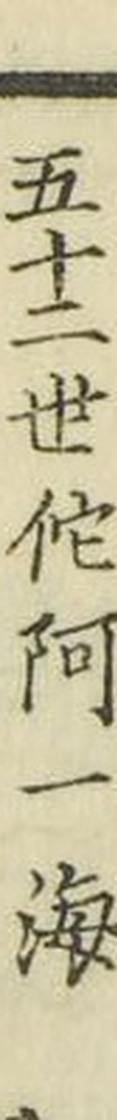五十二世佗阿一海
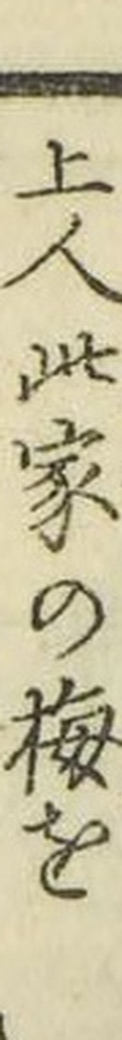上人此家の梅を
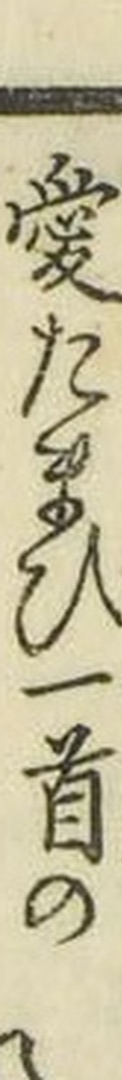愛たまひ一首の
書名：江戸名所図会 20巻 巻之7
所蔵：東京学芸大学教育コンテンツアーカイブ
